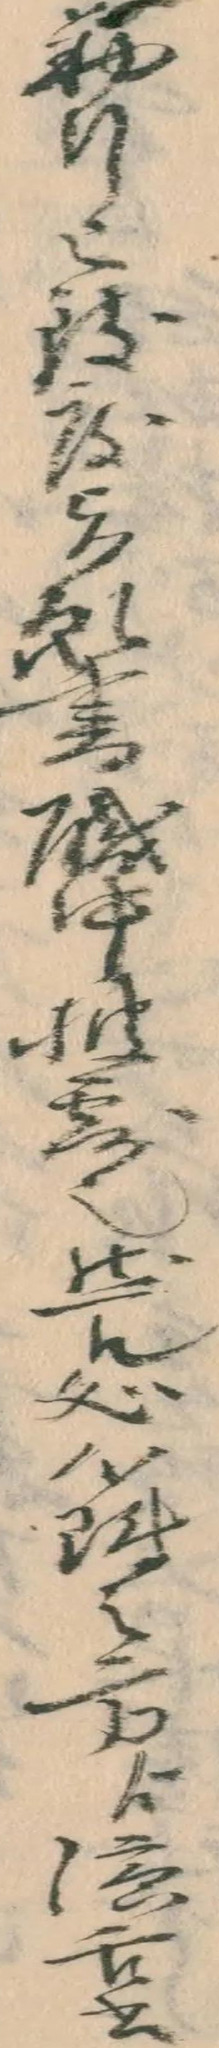勤行被致度旨願書職中披露也然ル処心附之方ゟ演舌書
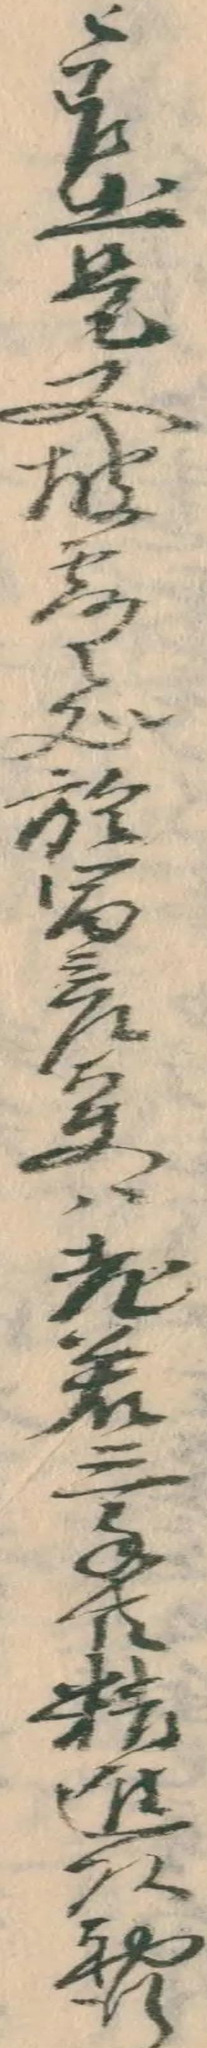被差出是又披露之処於冨彦大夫ハ老若三手共精進頭勤行
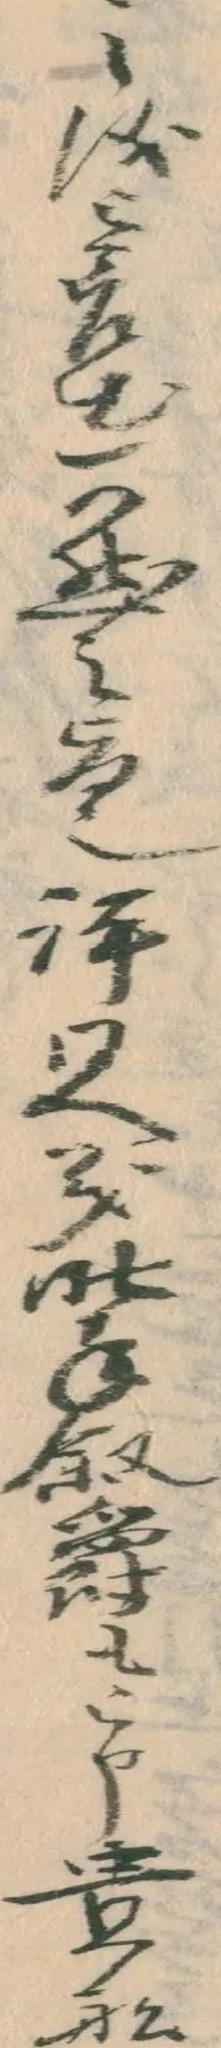之儀被差出可然之旨之評同人義昨年叙爵も被申貴舩
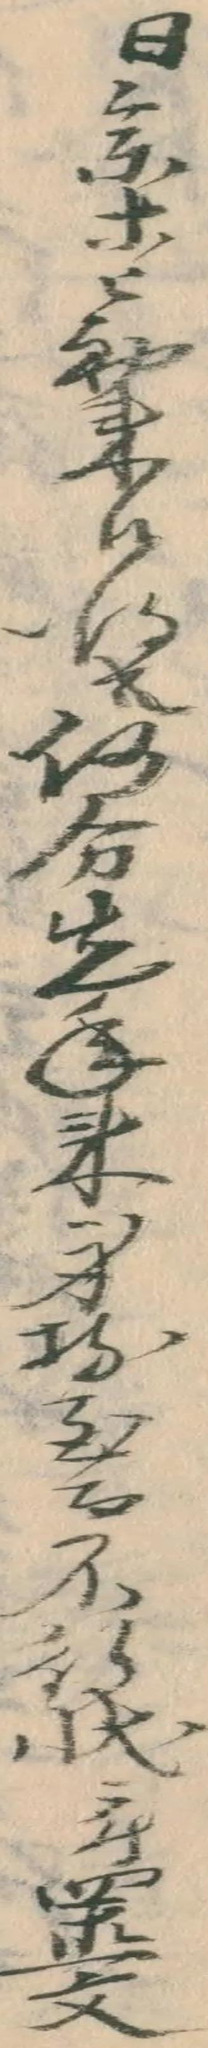日参等被勤来候得共何分先年来身持至而不行状ニ付置文
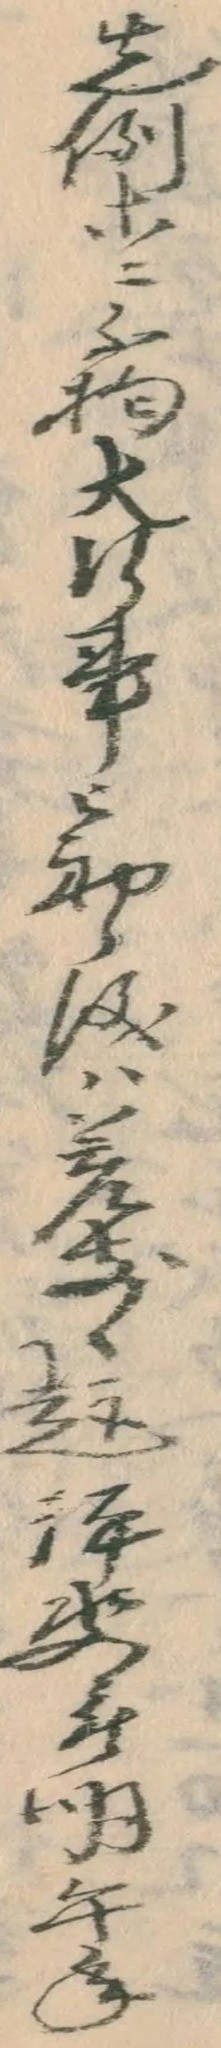先例等ニ不拘大行事被勤之儀ハ差支候趣評決ニ付明午年
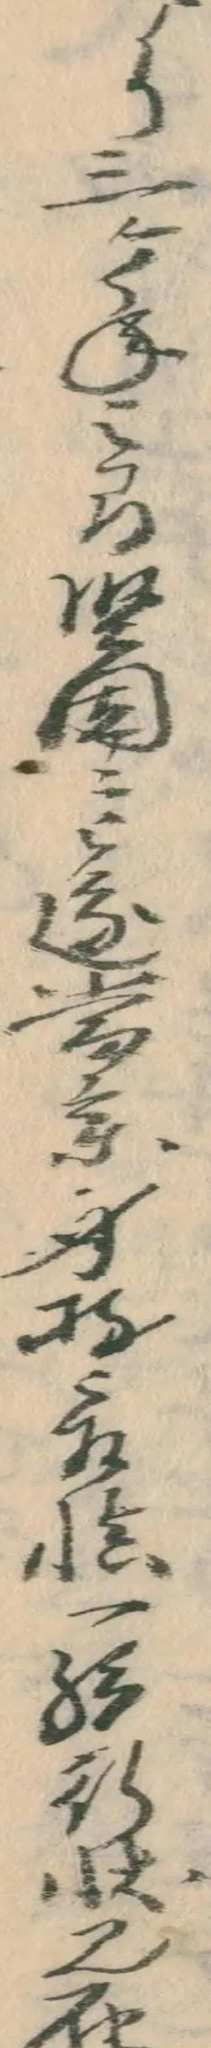より三ヶ年之間堅固ニ被遂當参身持被相慎一統行状見届
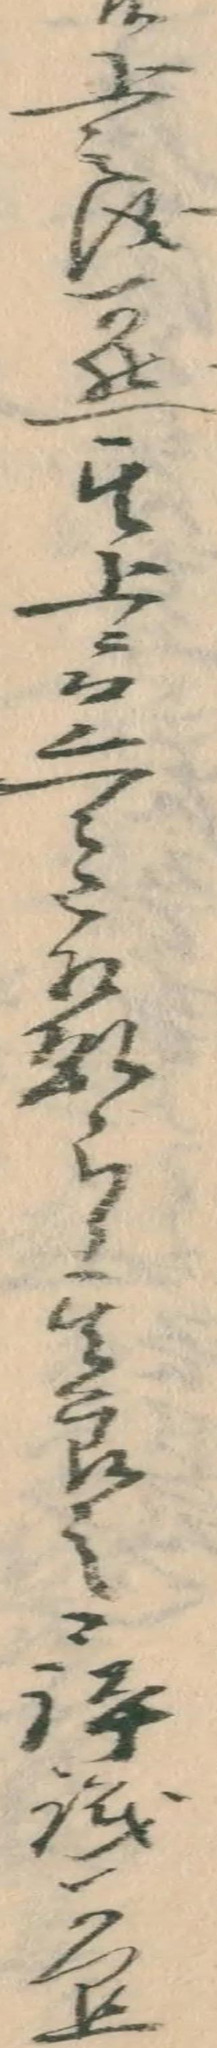候上之儀可然其上ニ而今々候相願候ハヽ其節之御評議可宜
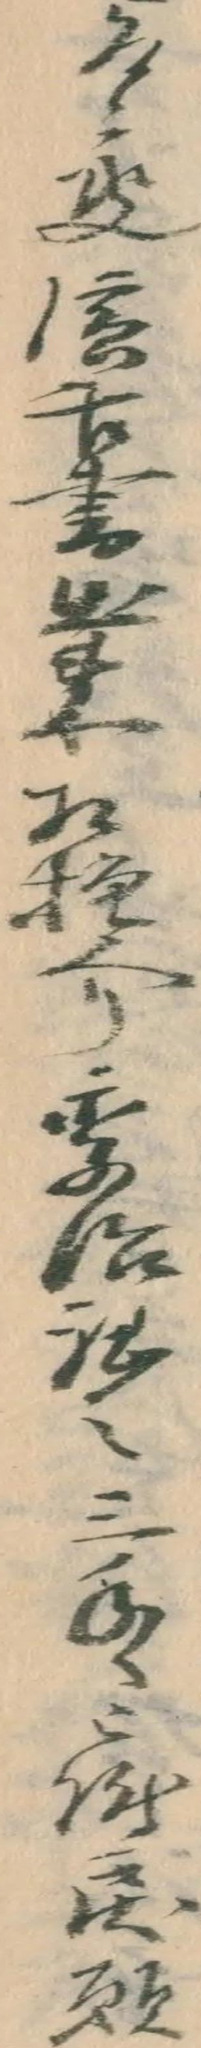旨ニ決演舌書出来相模介季治認之三手へ被附戻願

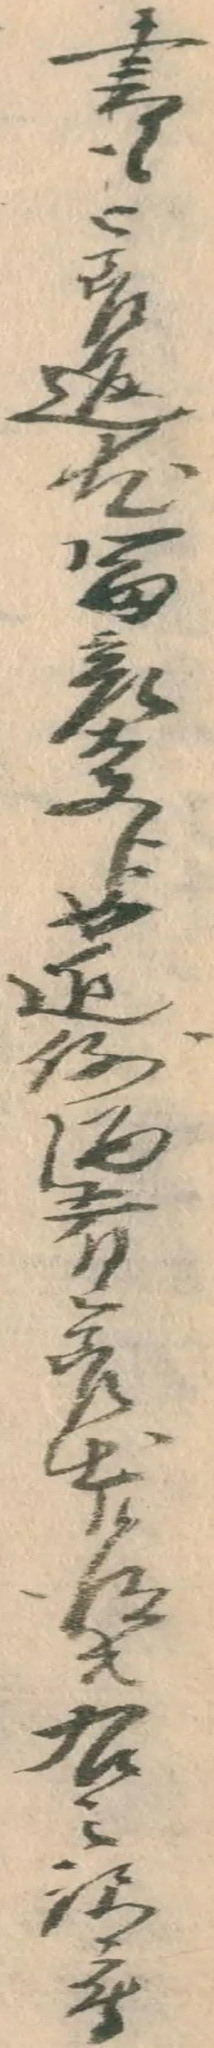書も被差返尤冨彦大夫ゟ如近例酒肴差出候得共右之訳ニ付
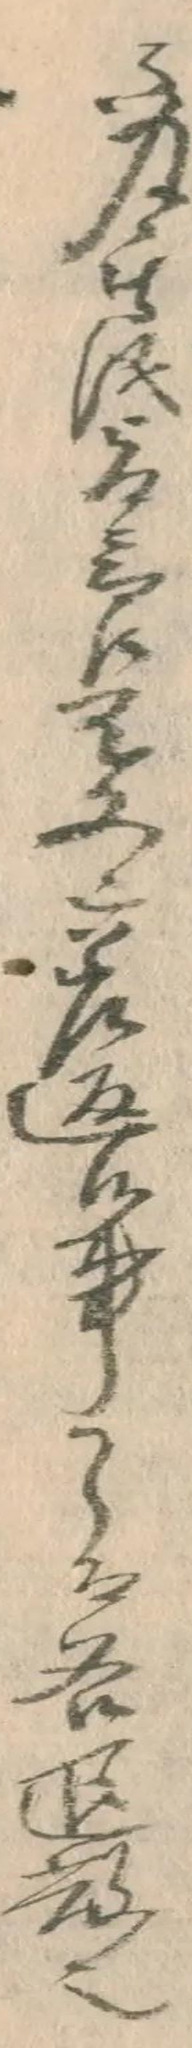不及其段旨ニ而候是又被差返候事終了而各退散也
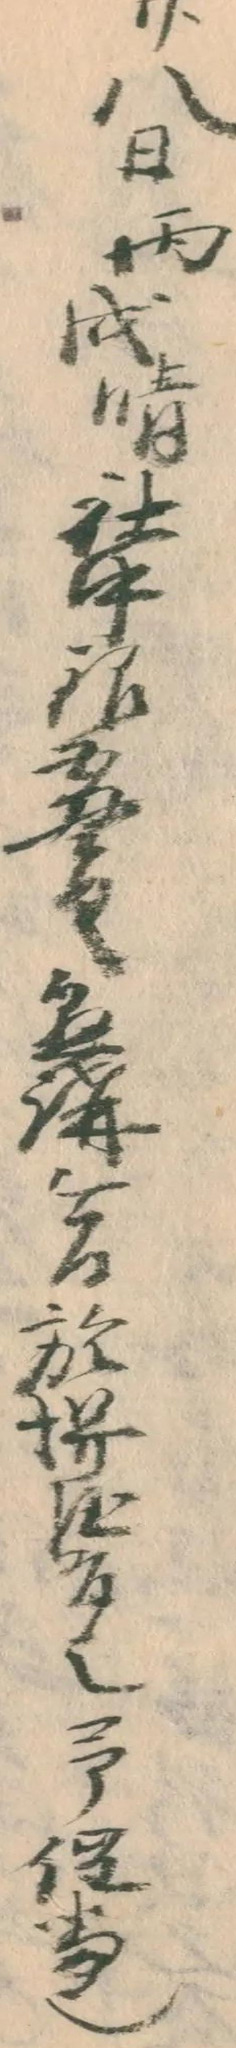廿八日丙戌晴社中銀五貫匁懸講今日於堺屋有之予催番也
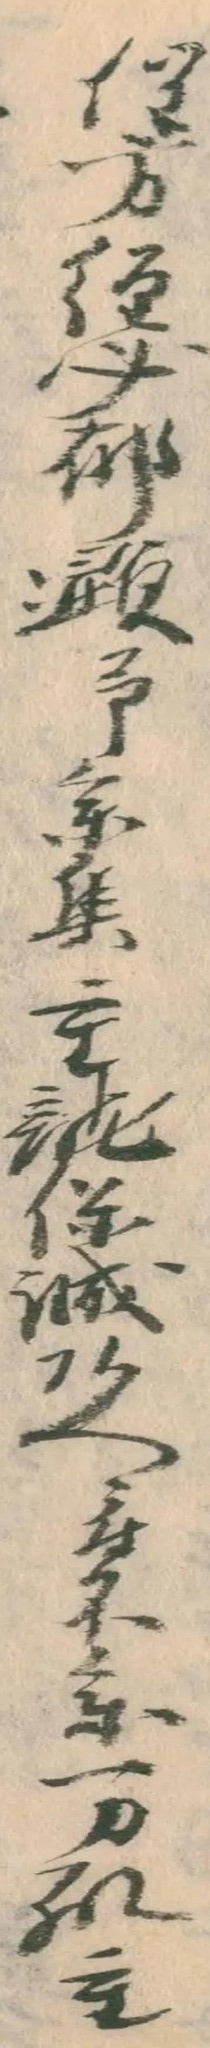催方経必郁顕予参集重龍保誠頭人ニ付不参万顕重
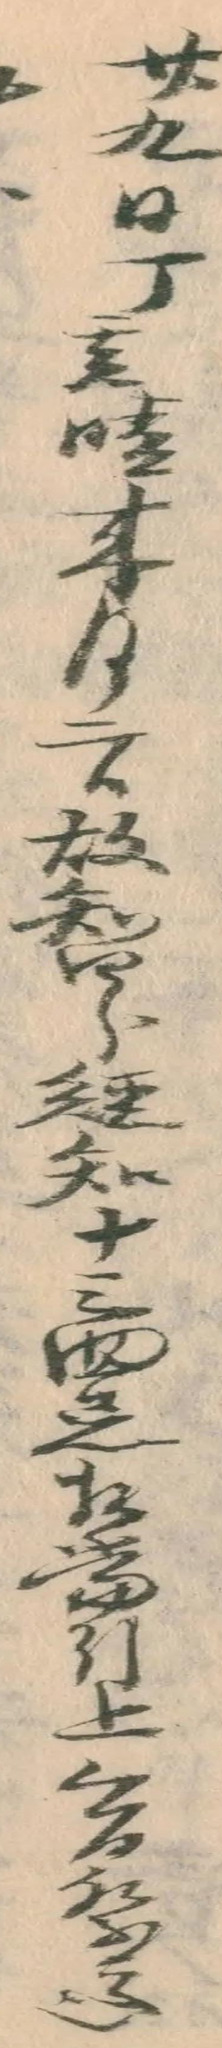廿九日丁亥晴来月二日故知四郎経知十三回忌相當引上今日祭礼也
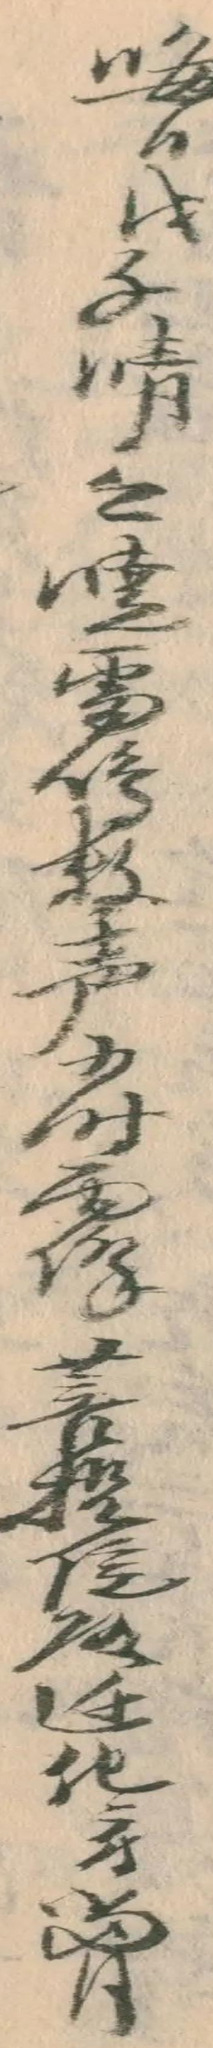晦日戊子晴迄暁雷鳴数声小時雨降菩提院殿遷化ニ付當月
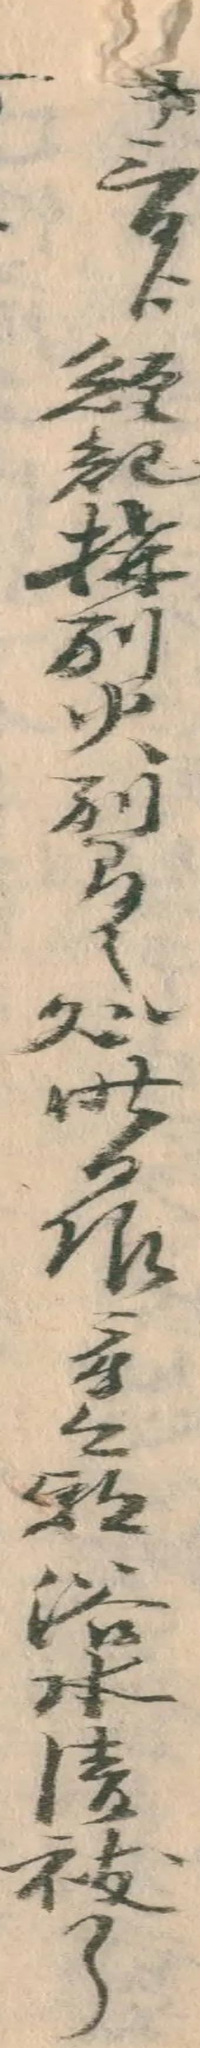廿三日ゟ経紀構別火別間之処昨日限ニ付今朝浴水清祓了
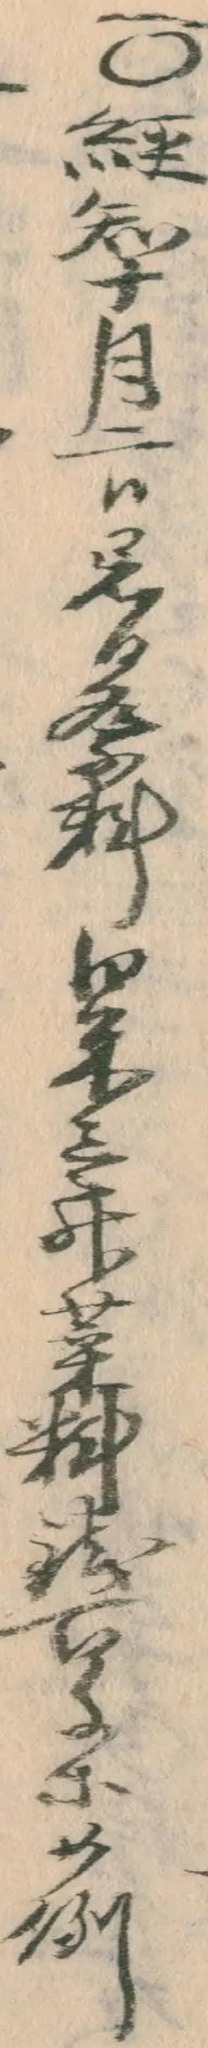○経知十月二日忌日祭料白米壱升菜料銭百文等如例
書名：賀茂社記録. 第70冊
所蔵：国立国会図書館 National Diet Library, JAPAN
